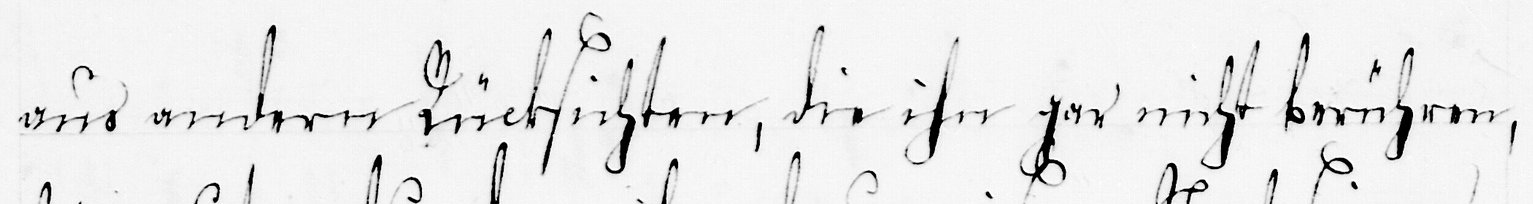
aus andern Rücksichten, die ihn gar nicht berühren,
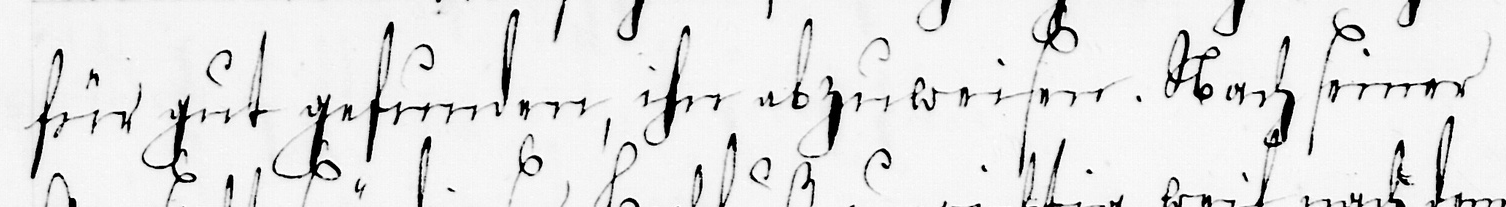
für gut gefunden, ihn abzuweisen. Nach seiner
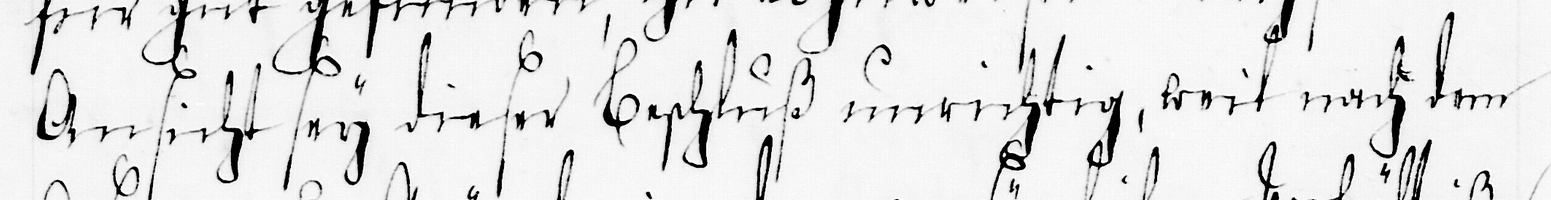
Ansicht sey dieser Beschluß unrichtig, weil nach dem
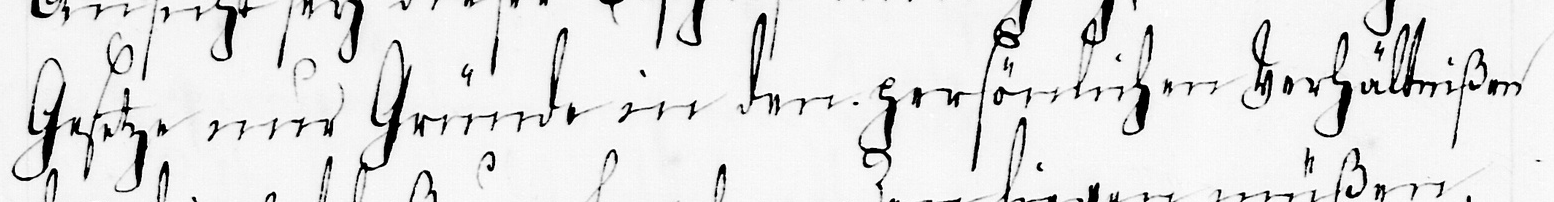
Gesetze nur Gründe in den persönlichen Verhältnißen
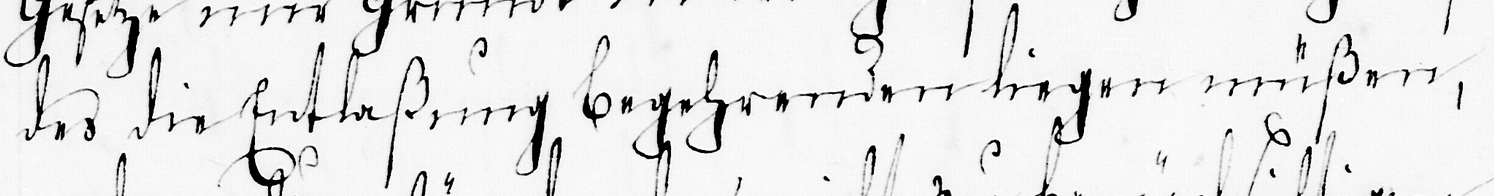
des die Entlaßung begehrenden liegen müßen,
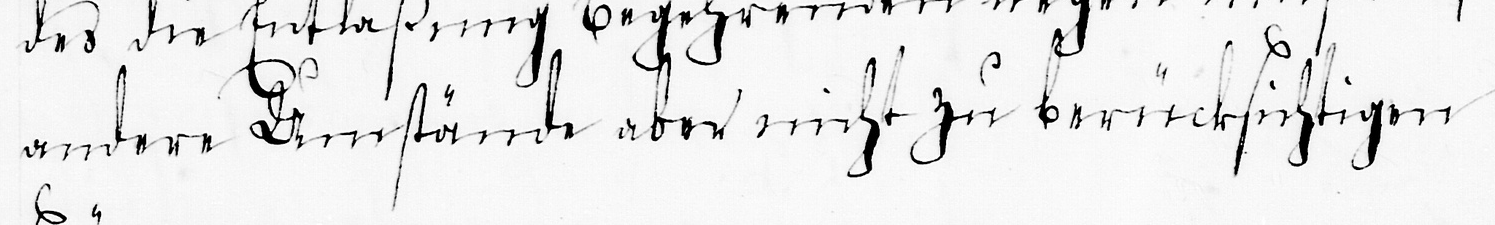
andere Umstände aber nicht zu berücksichtigen
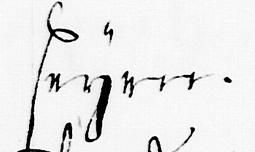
seyen.
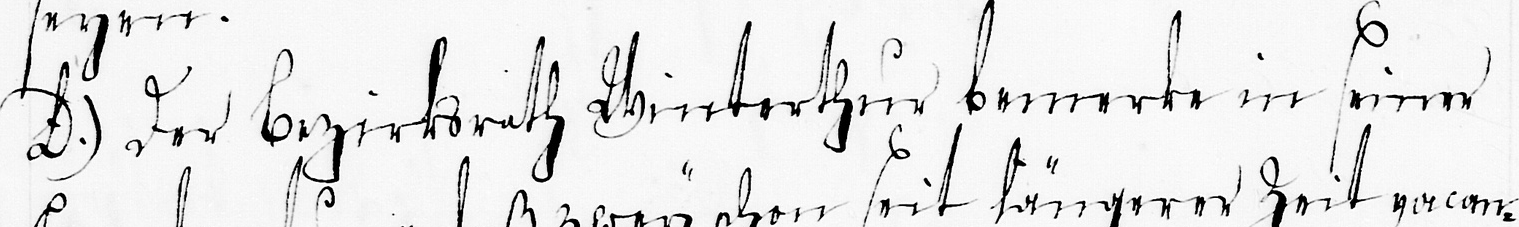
D.) Der Bezirksrath Winterthur bemerke in seiner
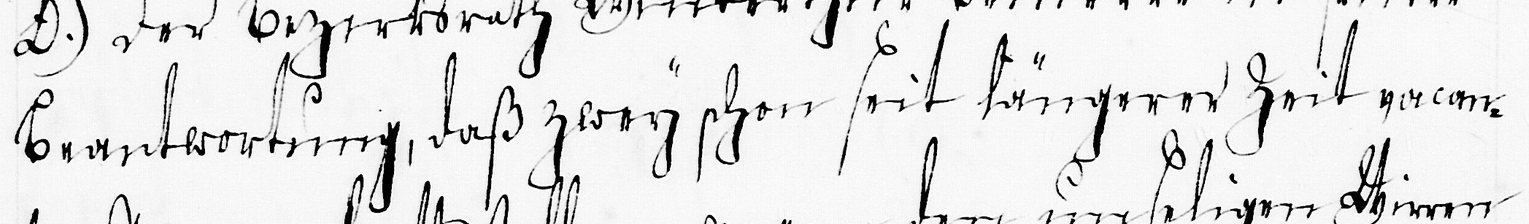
Beantwortung, daß zwey schon seit längerer Zeit vacan¬
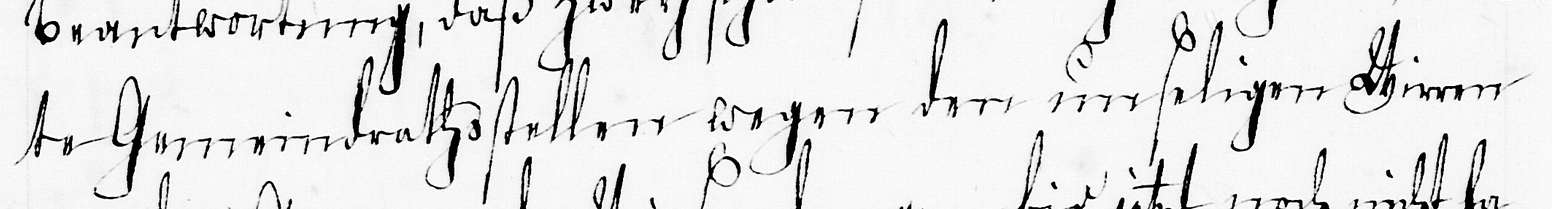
te Gemeindrathsstellen wegen den unseligen Wirren
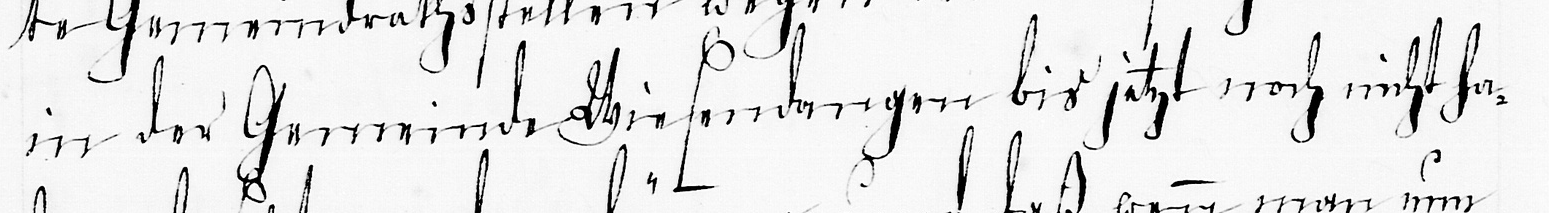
in der Gemeinde Wiesendangen bis jetzt noch nicht ha¬
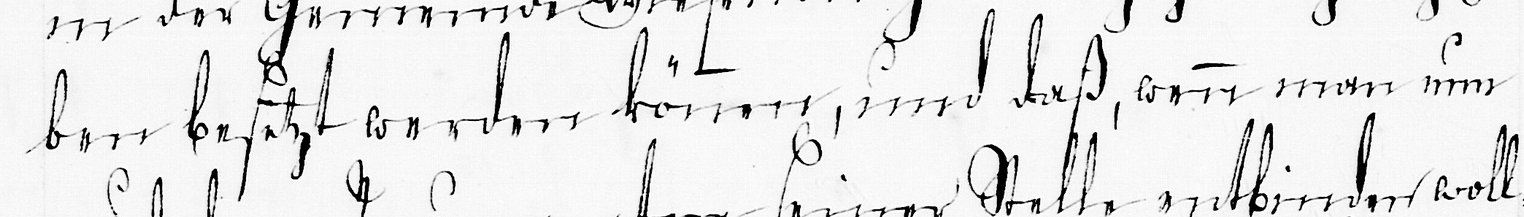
ben besetzt werden können, und daß, wenn man nun
